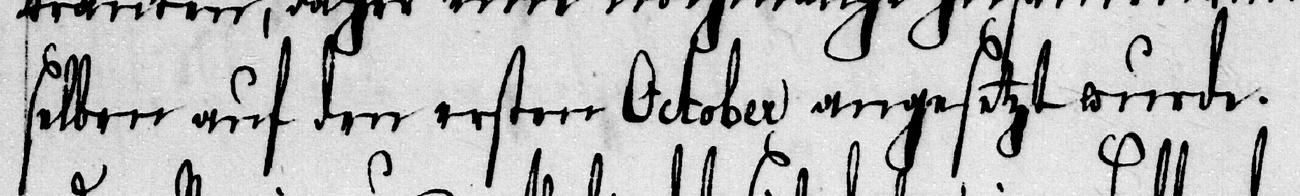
selben auf den ersten October angesetzt wurde.
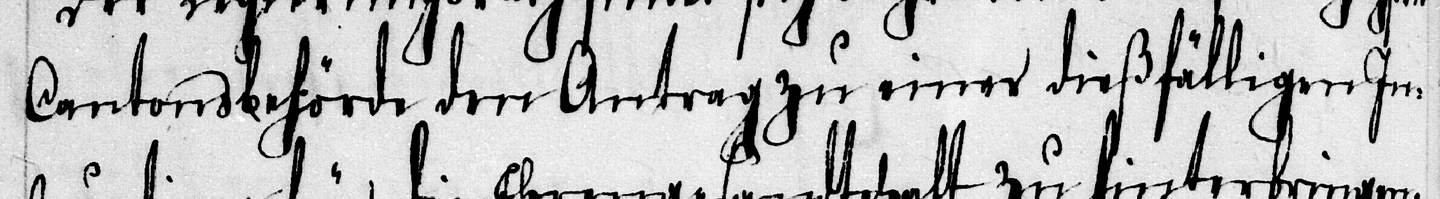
Cantonsbehörde den Antrag zu einer dießfälligen In¬
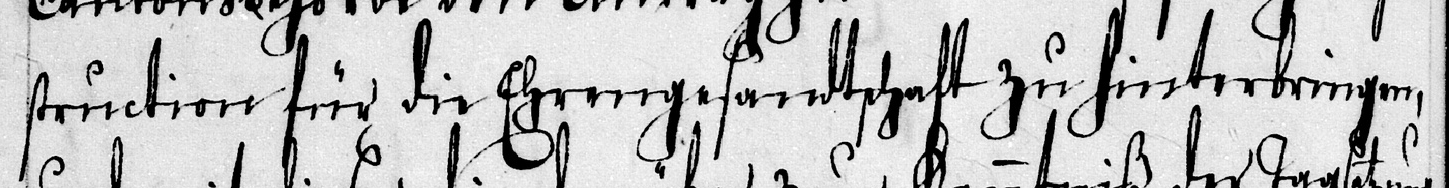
struction für die Ehrengesandtschaft zu hinterbringen,
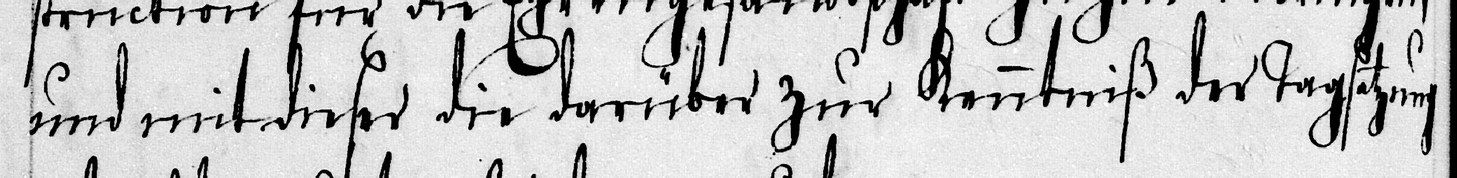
und mit dieser die darüber zur Kenntniß der Tagsatz¬
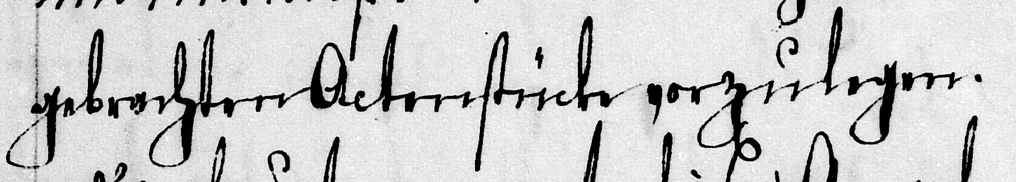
gebrachten Actenstücke vorzulegen.
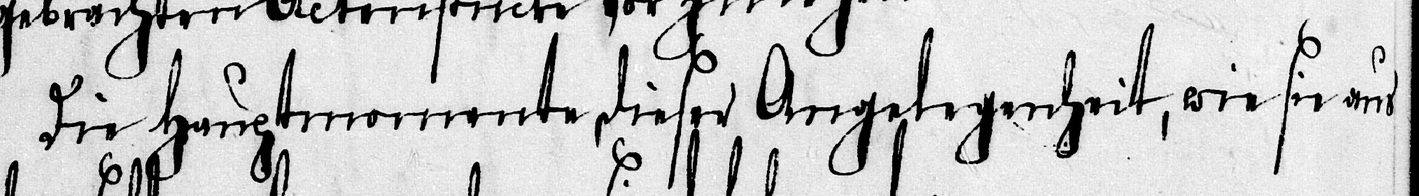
Die Hauptmomente dieser Angelegenheit, wie sie aus
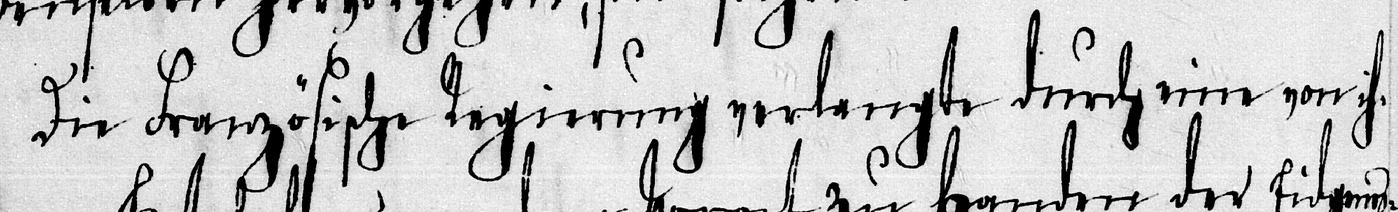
Die Französische Regierung verlangte durch eine von
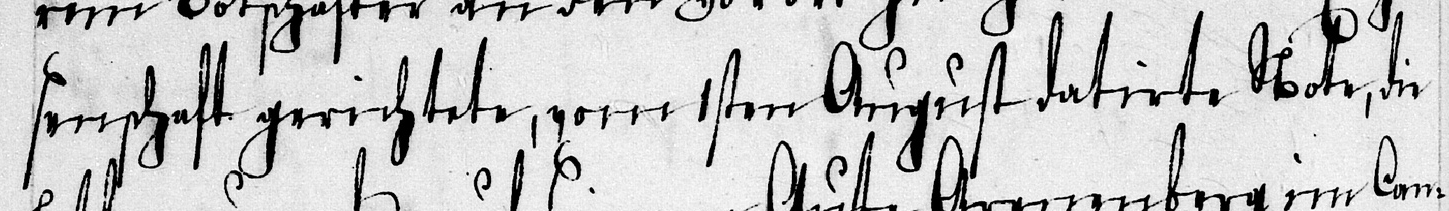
ßenschaft gerichtete, vom 1sten August datirte Note, die
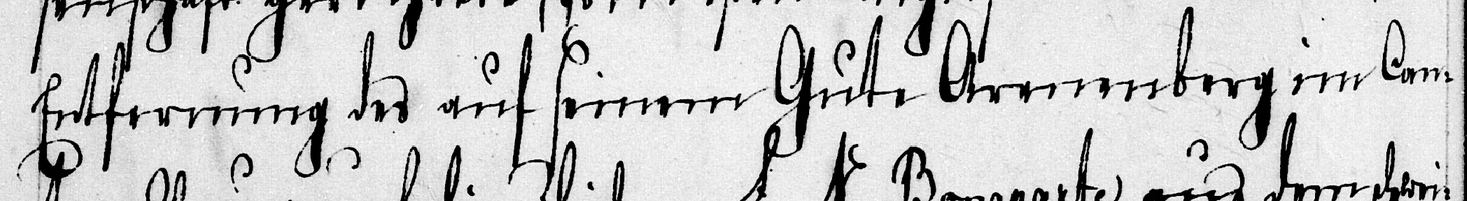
Entfernung des auf seinem Gute Arenenberg im Can¬
